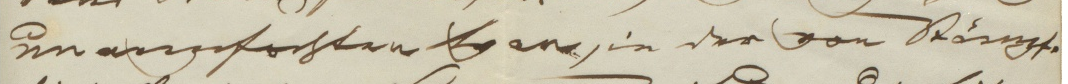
unangefochten war, in der von Stämpf-
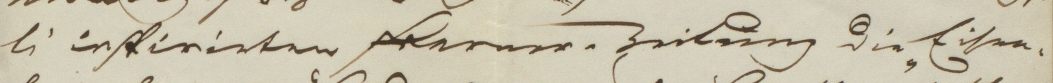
li inspirirten Berner–Zeitung die Eisen-
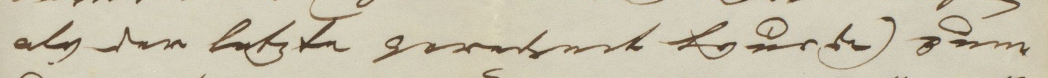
als der letzte gerechnet wurde) zum
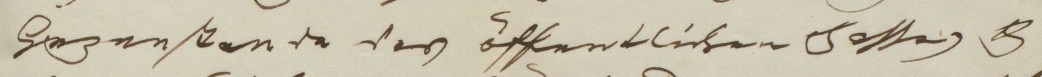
Gegenstande des öffentlichen Hasses &
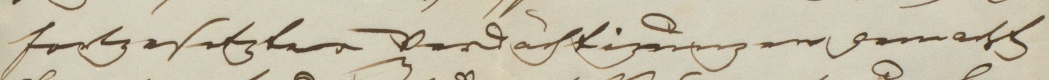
fortgesetzter Verdächtigungen gemacht
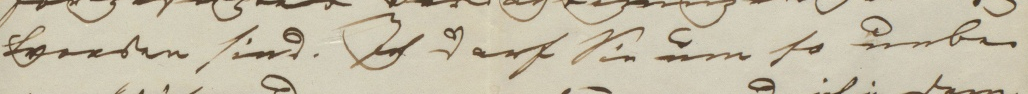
worden sind. Ich darf Sie um so unbe-
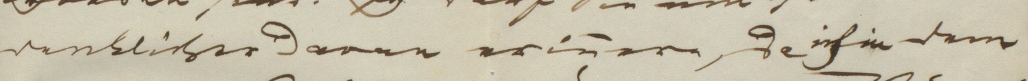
denklicher daran erinnern, da ich in dem
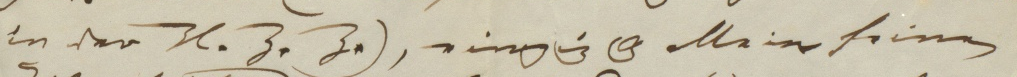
in der N.Z.Z.), einzig & allein seine
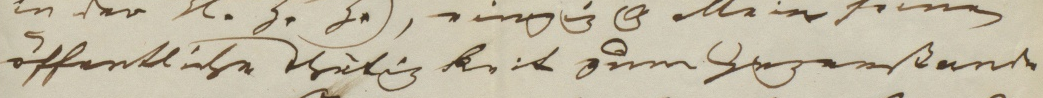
öffentliche Thätigkeit zum Gegenstande
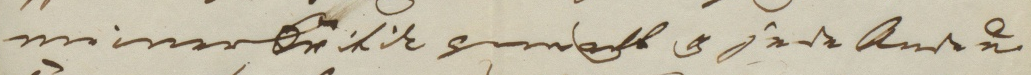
meiner Kritik gemacht & jede Andeu-
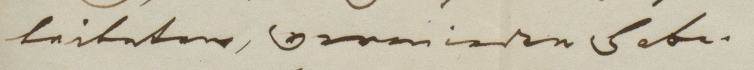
leiteten, vermieden habe.
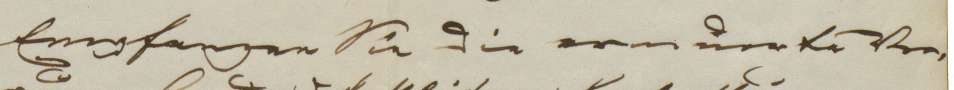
Empfangen Sie die erneuerte Ver-
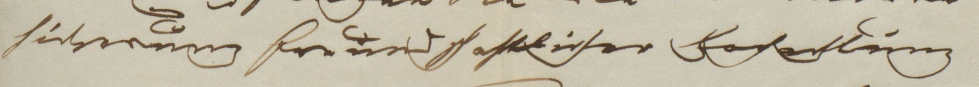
sicherung freundschaftlicher Hochachtung
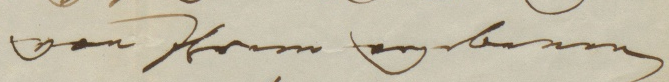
von Ihrem ergebenen
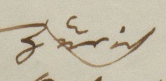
Zürich
